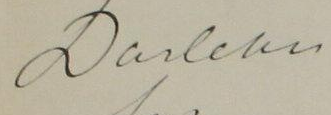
Darlehn
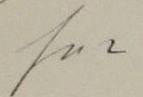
für
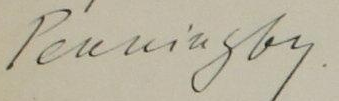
Penningby
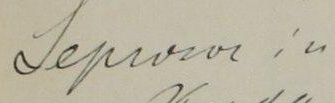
Lepros. in
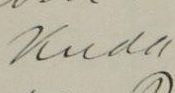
Kuda
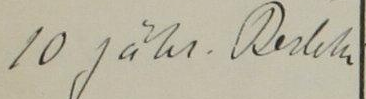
10 jähr. Bestehen
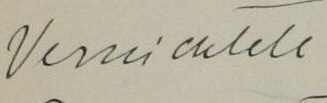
Vernichtete
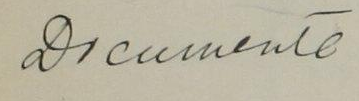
Documente
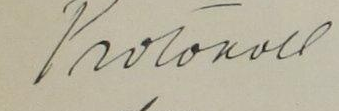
Protokoll
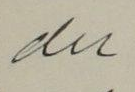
der
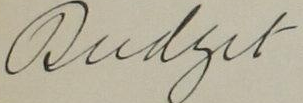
Budget
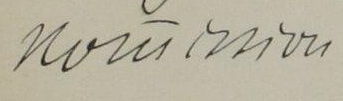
kommission
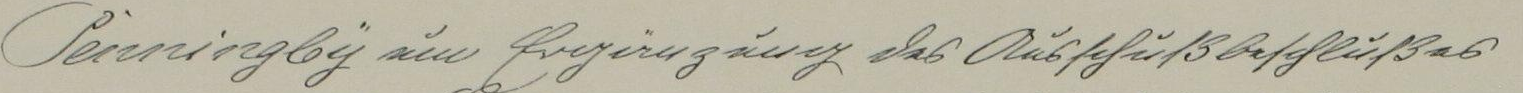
Penningby um Ergänzung des Ausschußbeschlußes
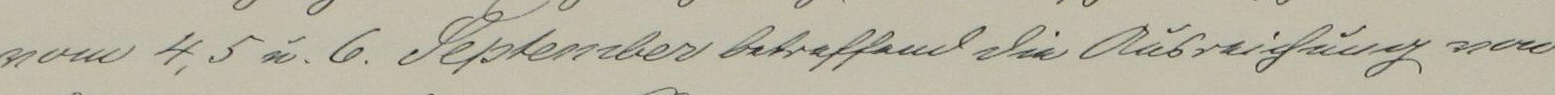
vom 4, 5 u. 6. September betreffend die Ausreichung von
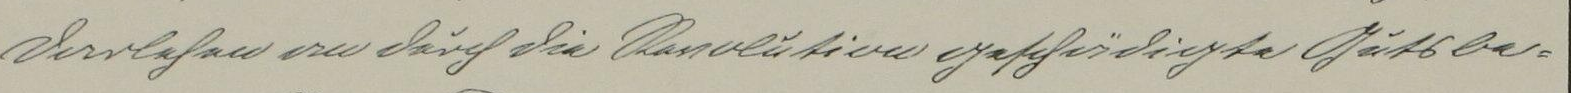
Darlehen an durch die Revolution geschädigte Gutsbe-
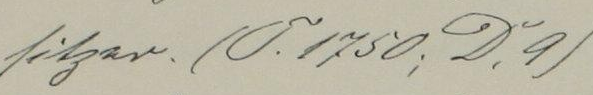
sitzer (T.1750; D.9)
